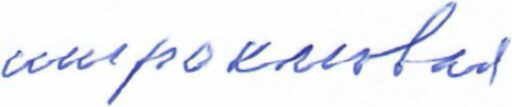широклювая
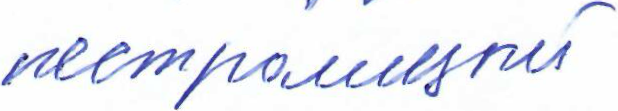пестролицый
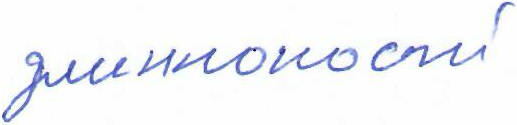длинноносый
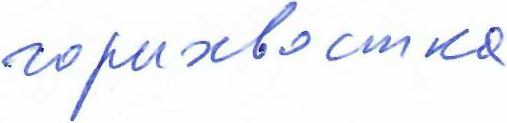горихвостка
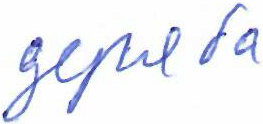деряба
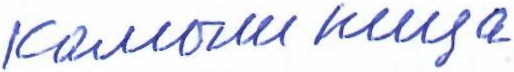камыш ница
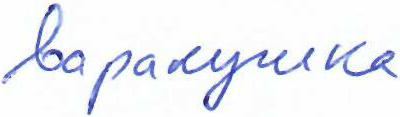варакушка
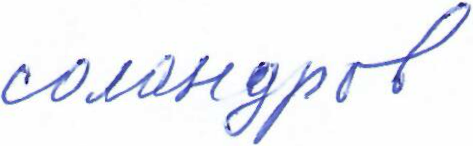соландров
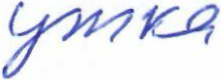утка
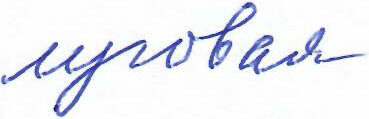луговая
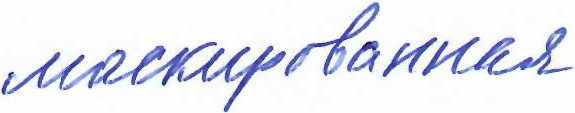маскированная
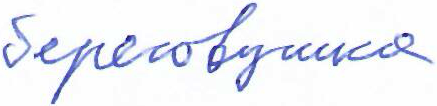береговушка
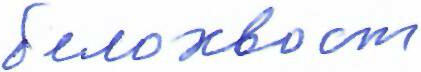белохвост
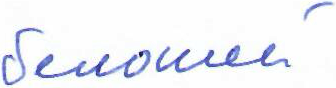белошей
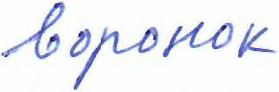воронок
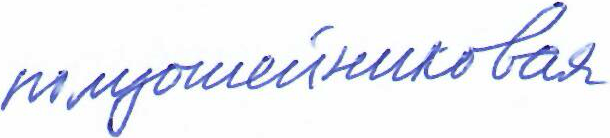полуошейниковая
